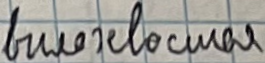вилохвостая
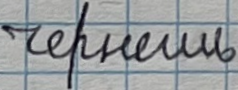чернеть
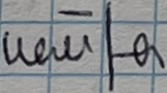кайра
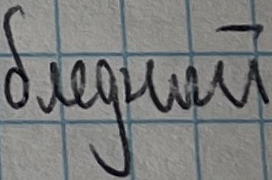бледный
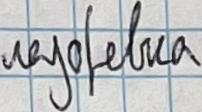лазоревка
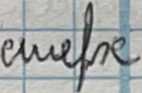стерх
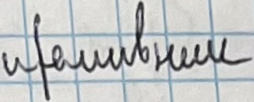прапивник
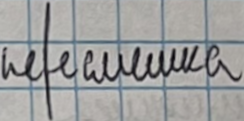пересмешка
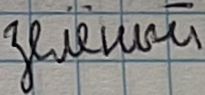зелёный
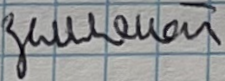земляной
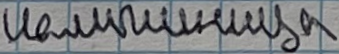камышница
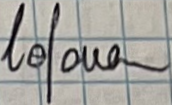ворона
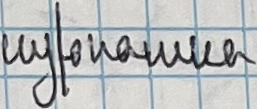куропатка
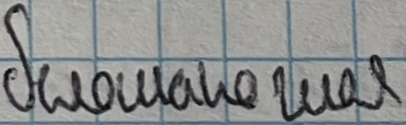белошапочная
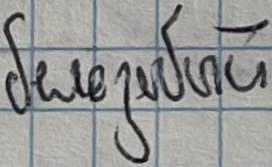белозобый
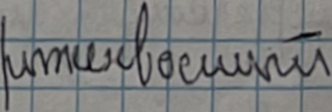рыжехвостый
